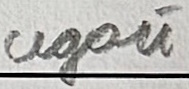седой
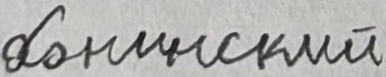бонинский
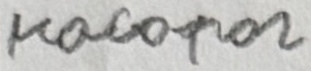носорог
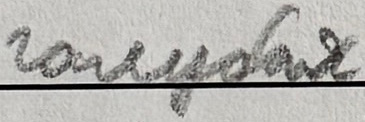голубая
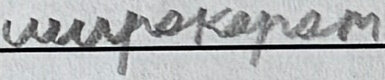широкорот
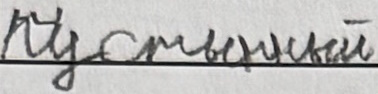пустынный
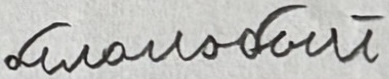белолобый
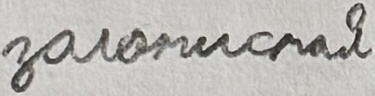золотистая
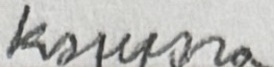конюга
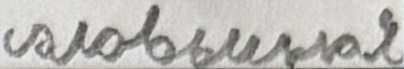соловьиная
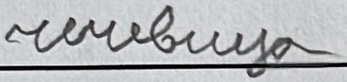чечевица
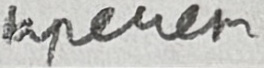кречет
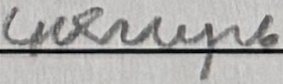снегирь
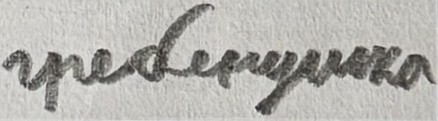гребенушка
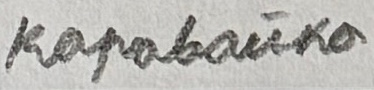каравайка
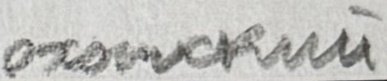охотский
